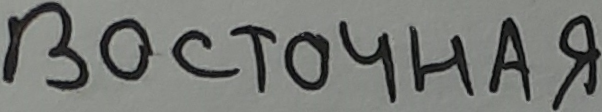восточная
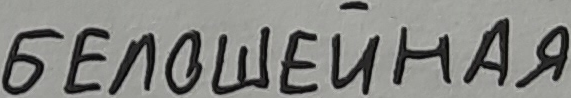белошейная
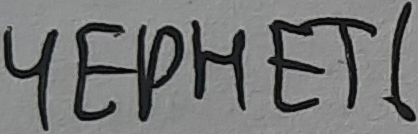чернеть
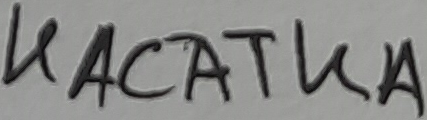касатка
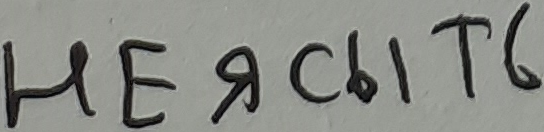неясыть
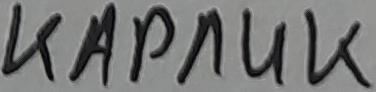карлик
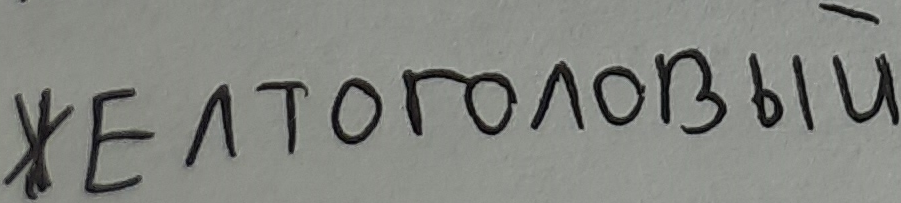желтоголовый
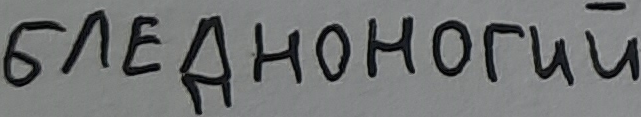бледноногий
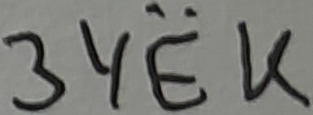зуёк
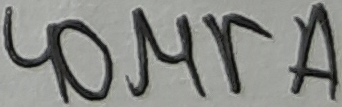чомга
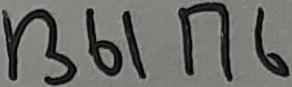выпь
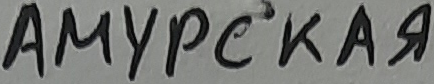амурская
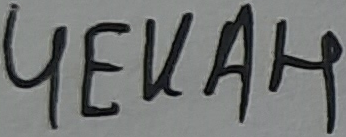чекан
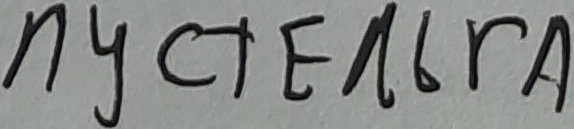пустельга
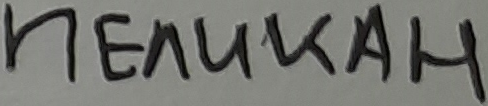пеликан
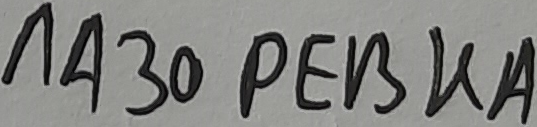лазо ревка
